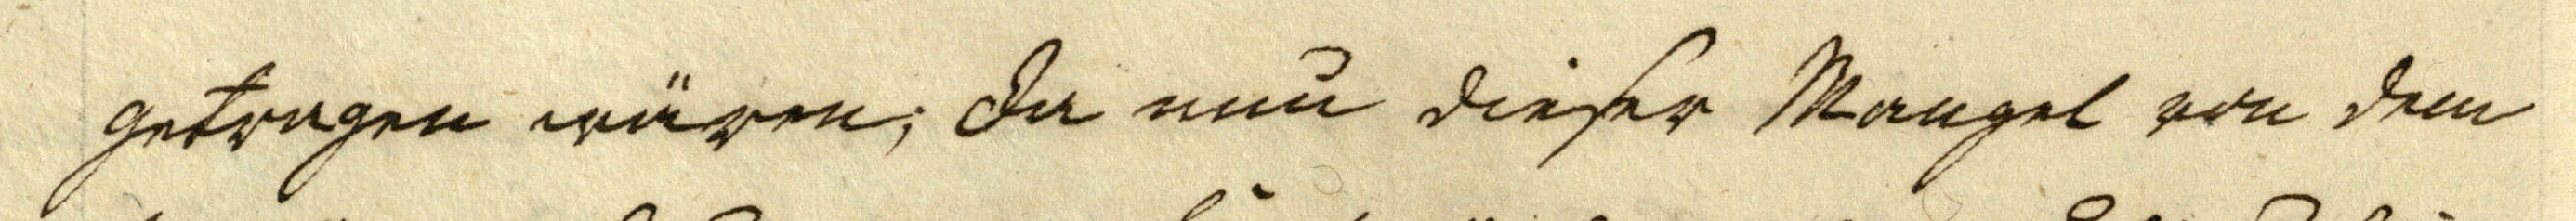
getragen wären, da nun dieser Mangel von dem
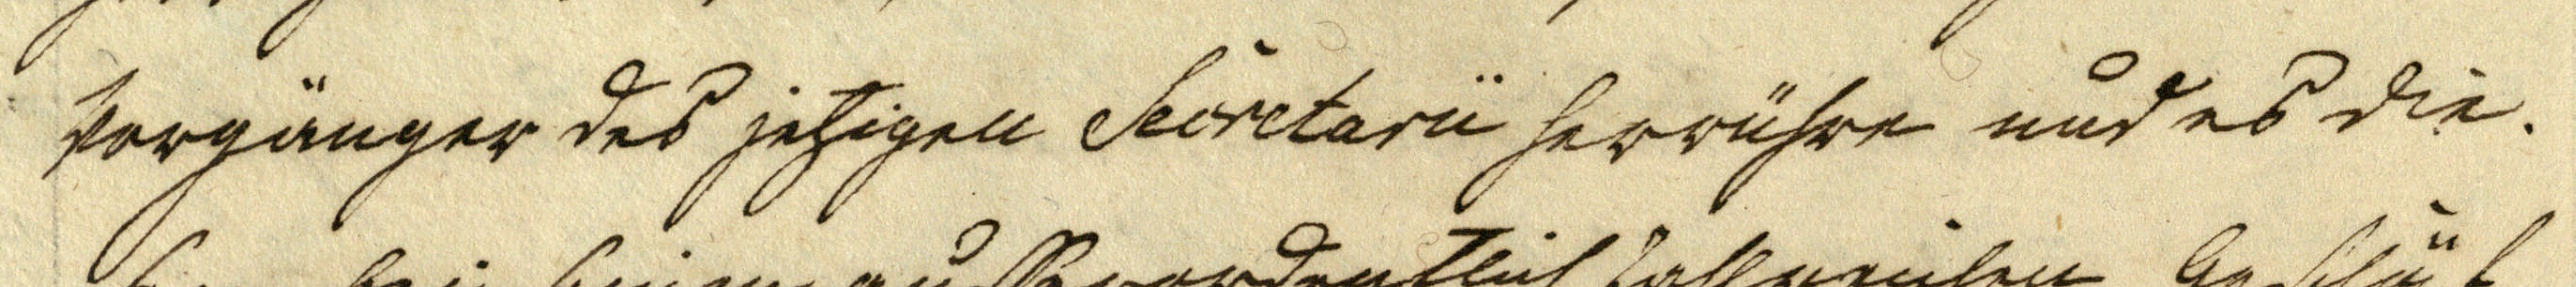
Vorgänger des jetzigen Secretarii herrühre und es die-
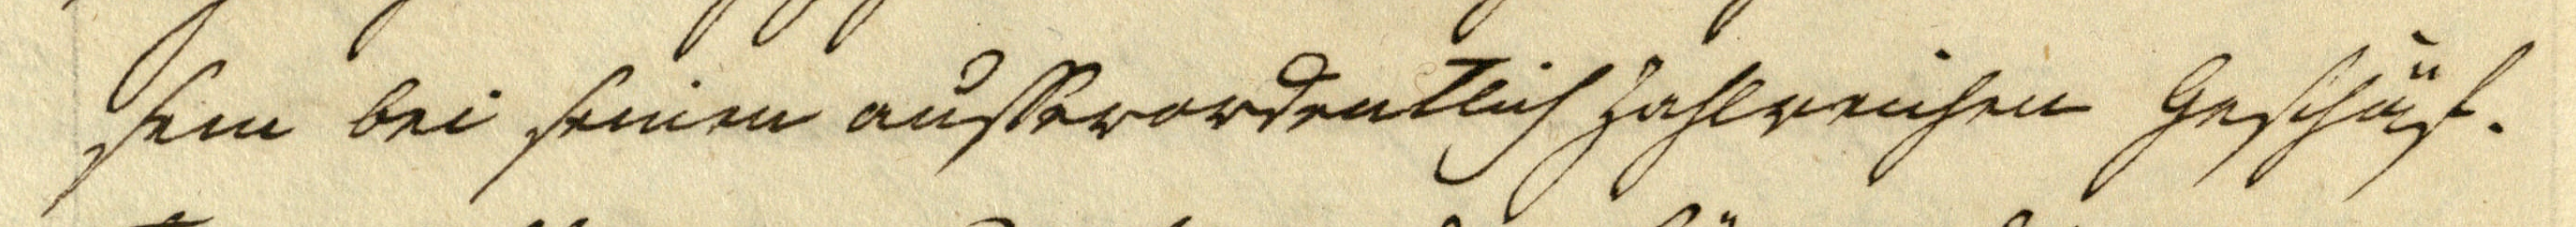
sem bei seinen ausserordentlich zahlreichen Geschäf-
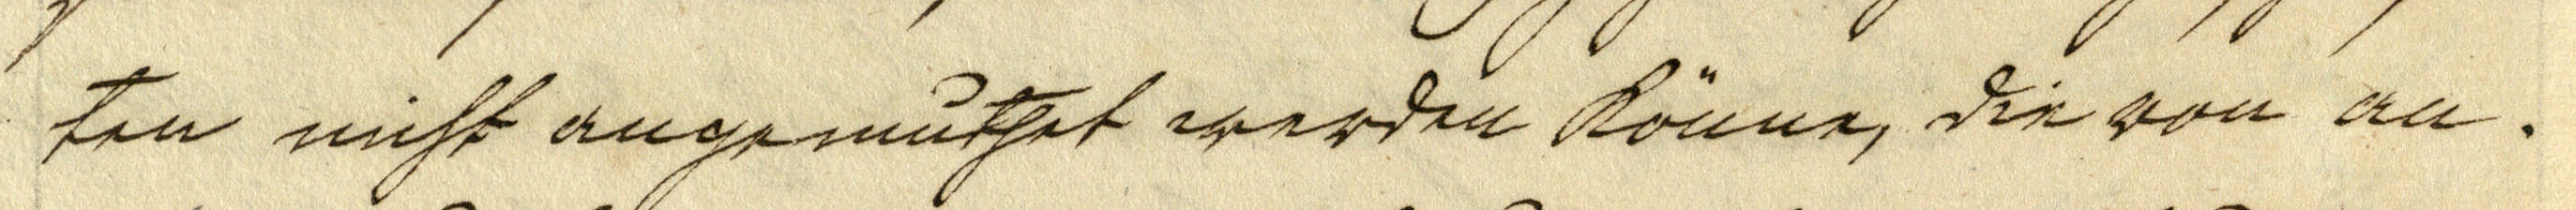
ten nicht angemuthet werden könne, die von an-
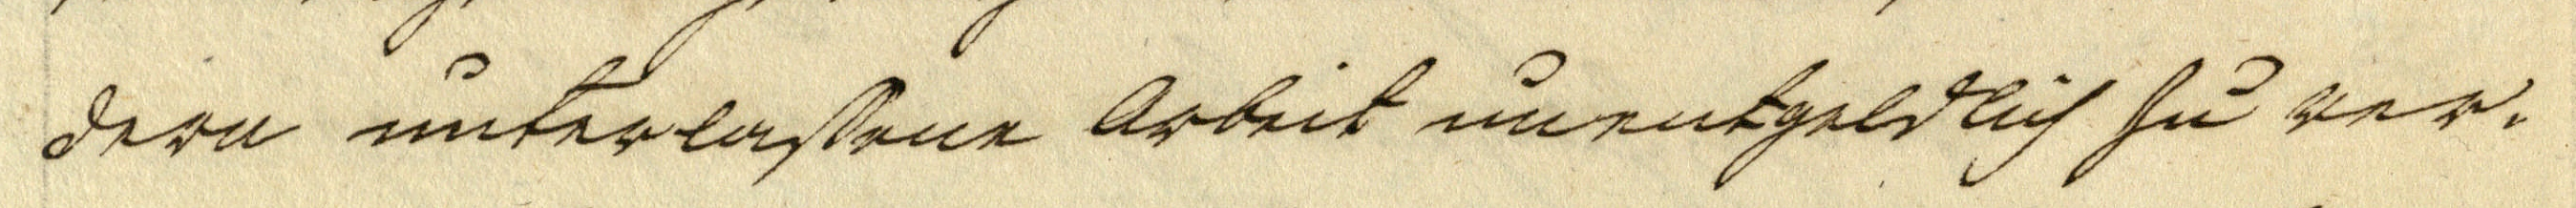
dern unterlassene Arbeit unentgeldlich zu ver-
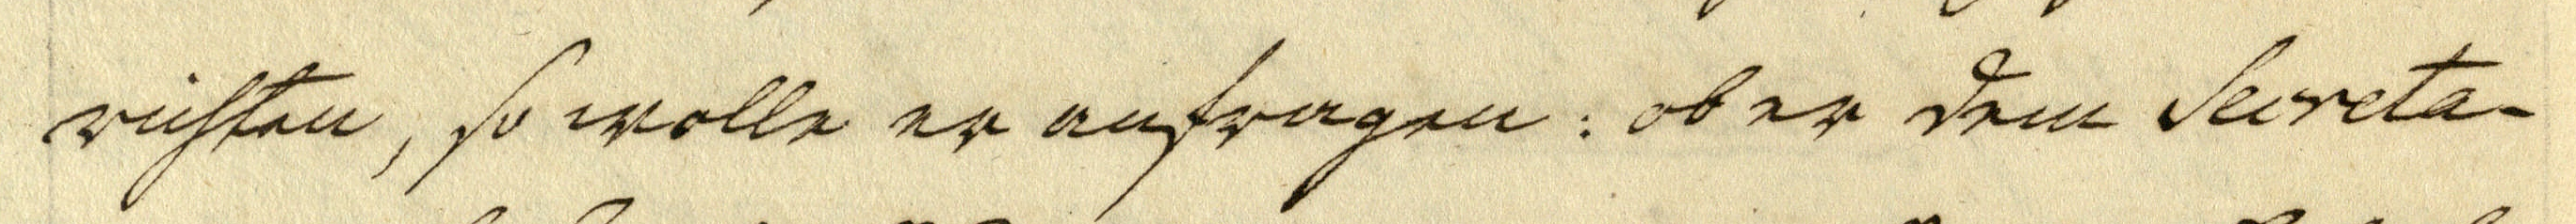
richten, so wolle er anfragen: ob er dem Secreta-
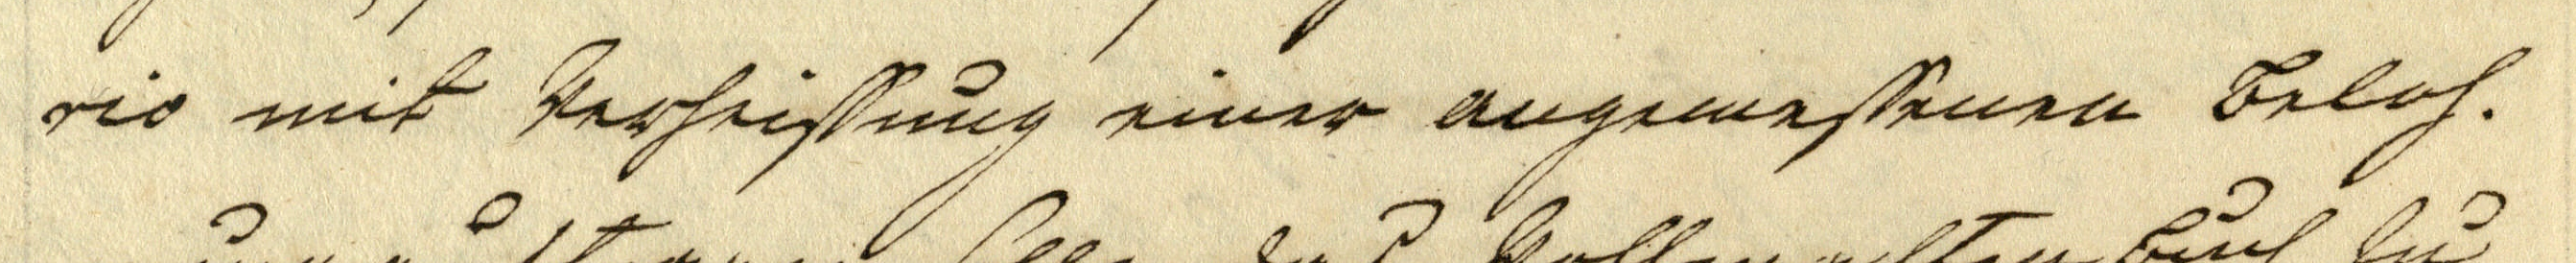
rio mit Verheissung einer angemessenen Beloh-
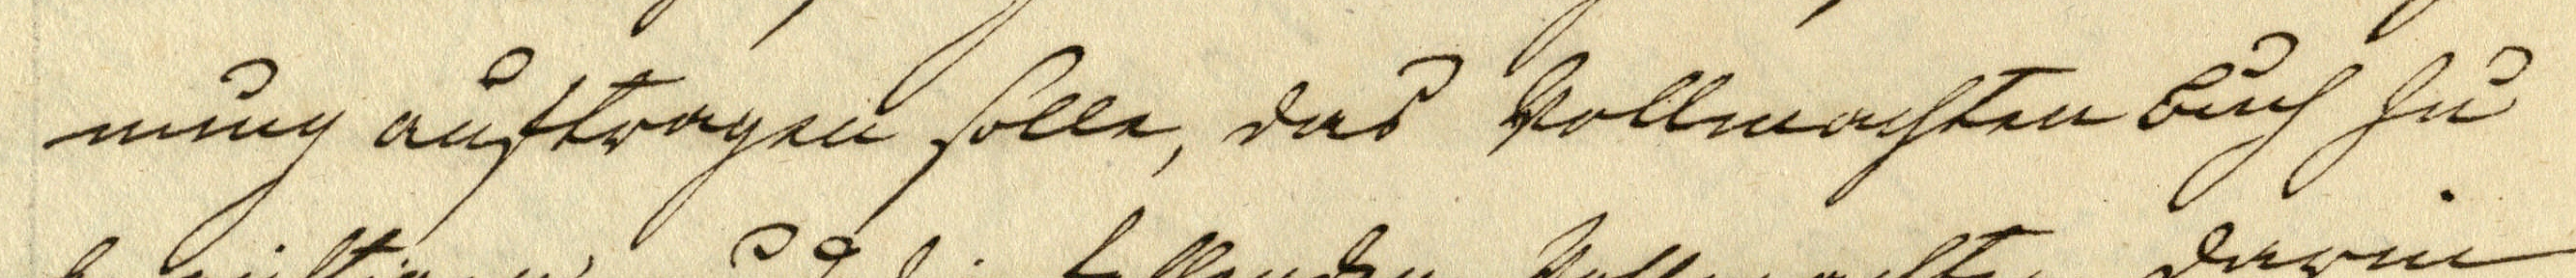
nung auftragen solle, das Vollmachten Buch zu
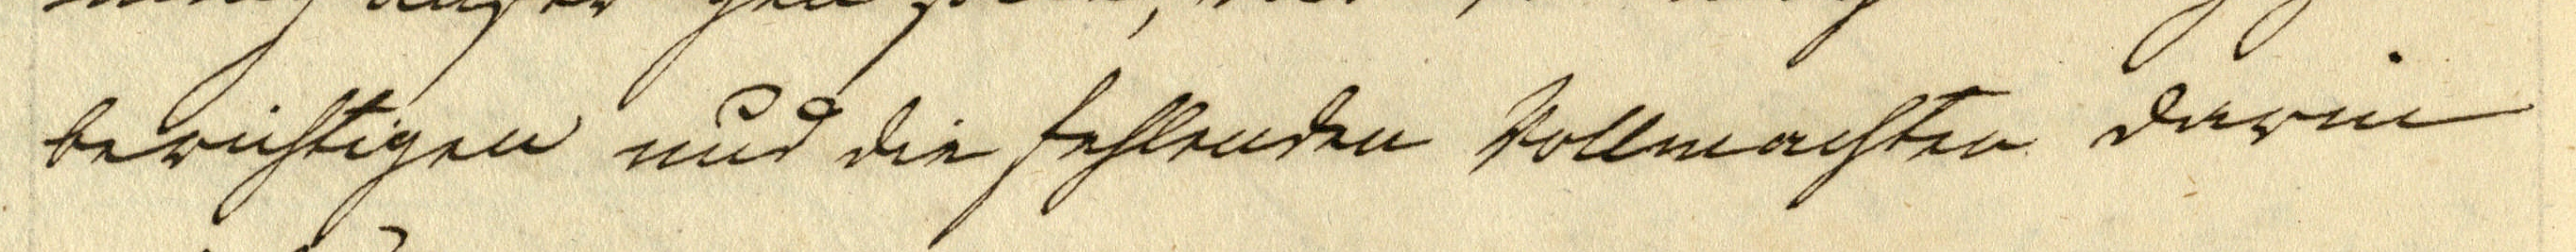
berichtigen und die fehlenden Vollmachten darin
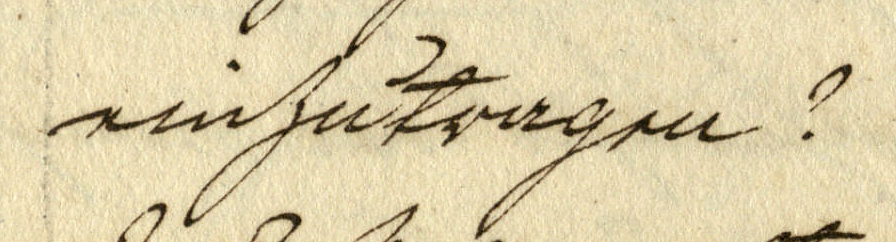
einzugragen?
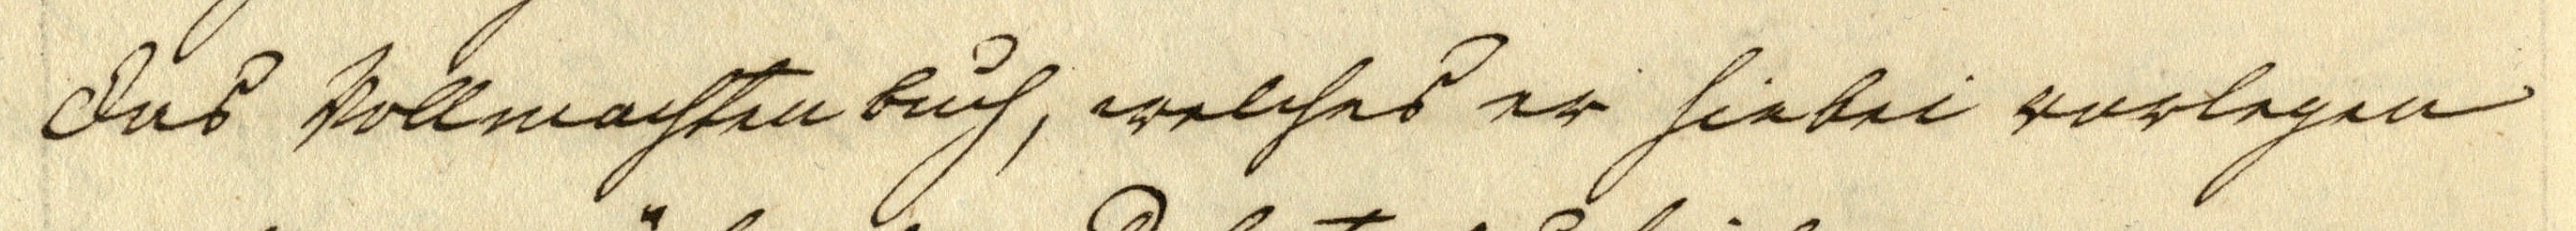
Das Vollmachten Buch, welches er hiebei vorlegen
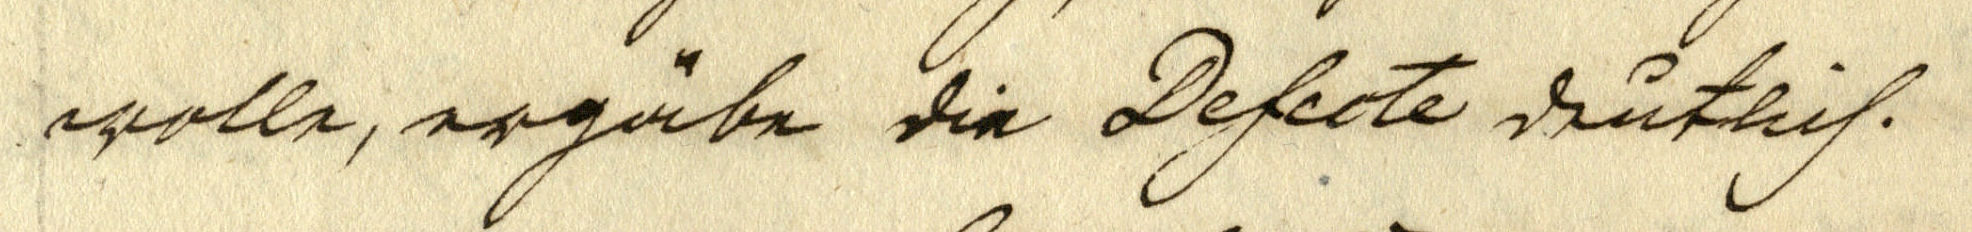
wolle, ergäbe die Defecte deutlich.
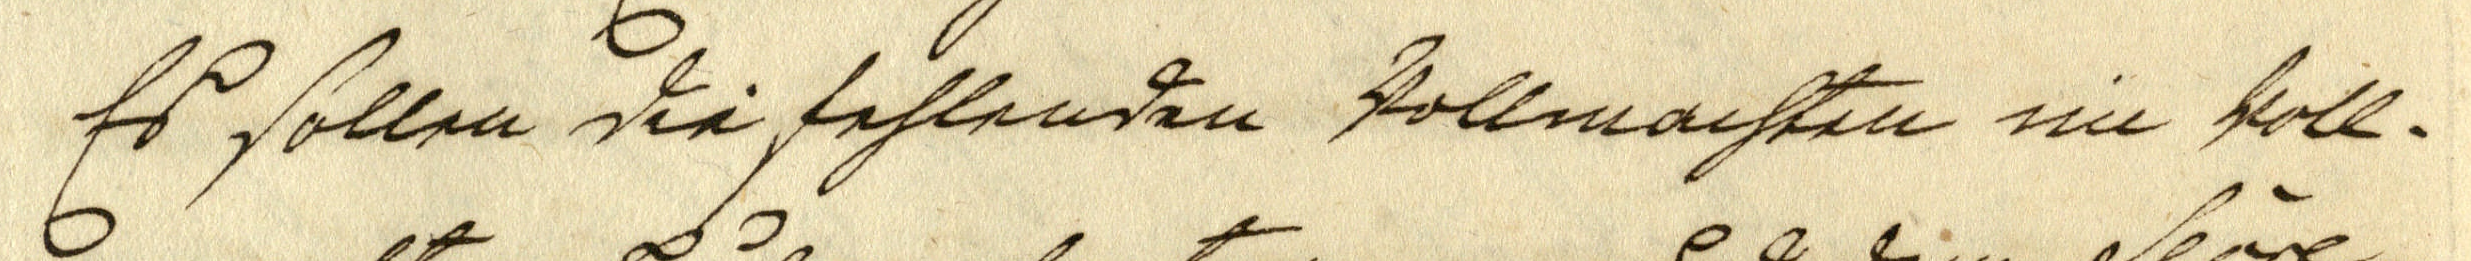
Es sollen die fehlenden Vollmachten im Voll-
